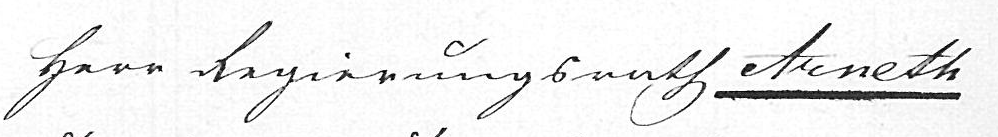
Herr Regierungsrath Arneth
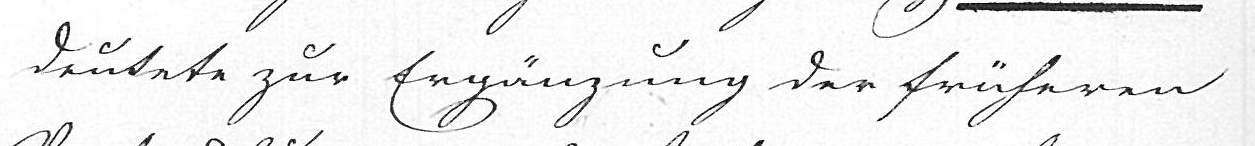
deutet zur Ergänzung der früheren
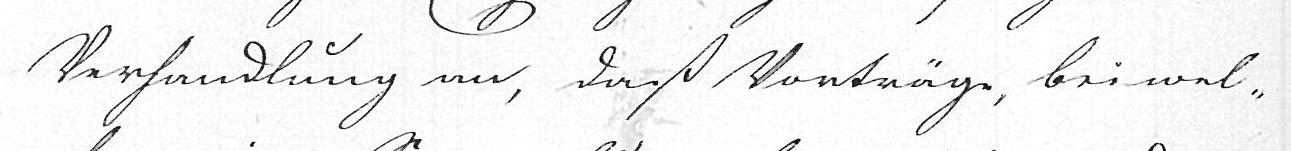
Verhandlung an, daß Vorträge, bei wel-
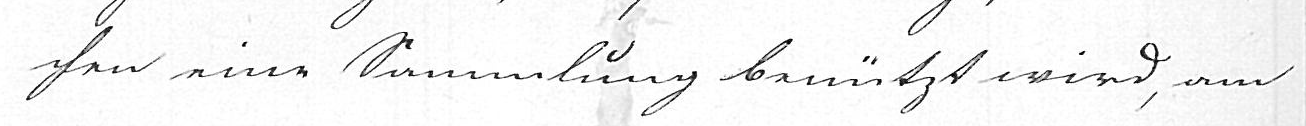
chen eine Samlung benützt wird, am
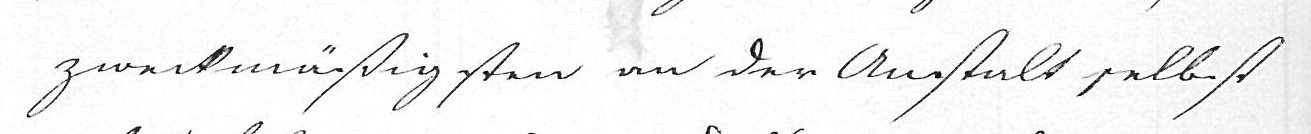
zweckmäßigsten an der Anstalt selbst
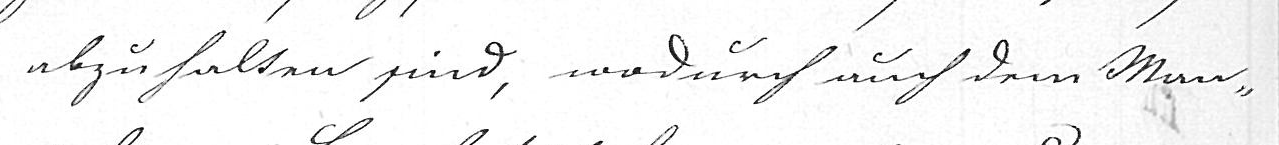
abzuhalten sind, wodurch auch dem Man-
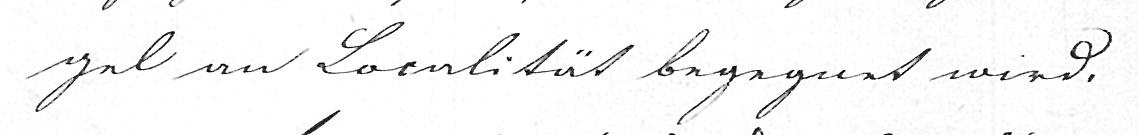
gel an Localität begegnet wird.
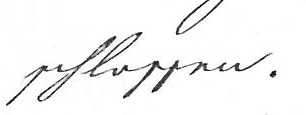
schlossen.
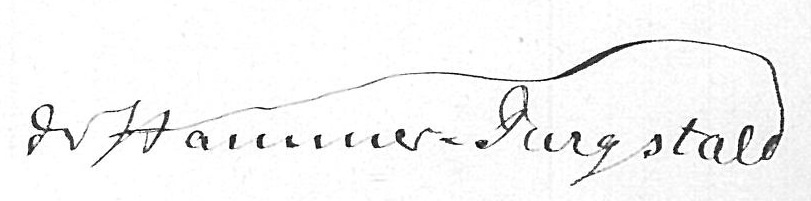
JvHammer-Purgstall
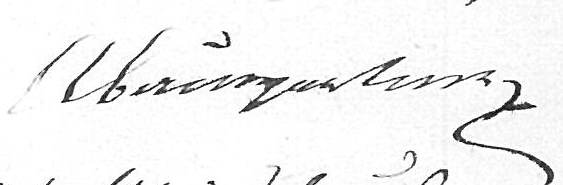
ABaumgartner
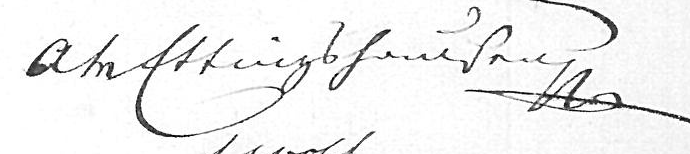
AvEttingshausen
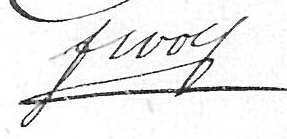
FWolf
